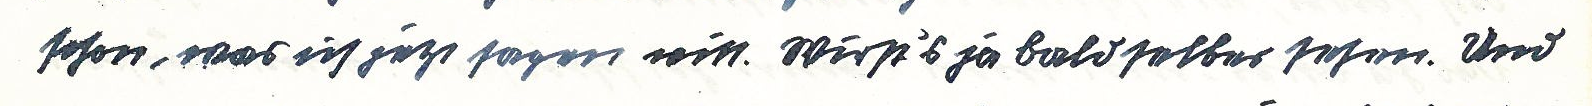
schon, was ich jetzt sagen will. Wirst’s ja bald selber sehen. Und
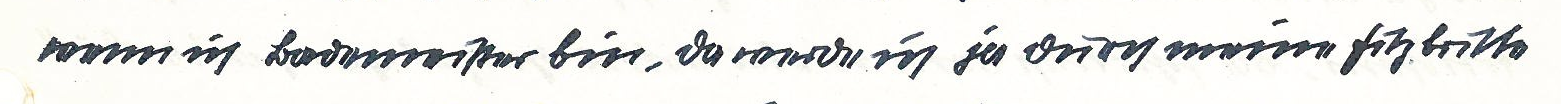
wenn ich Bademeister bin, da werde ich ja durch meine Fitzbrille
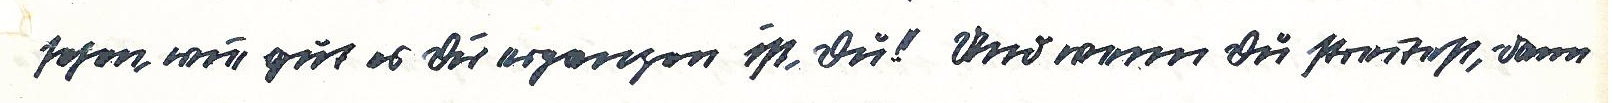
sehen, wie gut es Dir ergangen ist, Du!! Und wenn Du streitest, dann
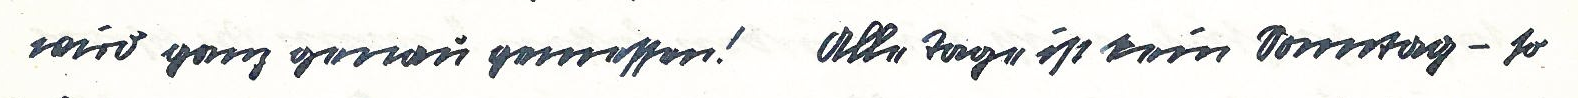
wird ganz genau gemessen! Alle Tage ist kein Sonntag – so
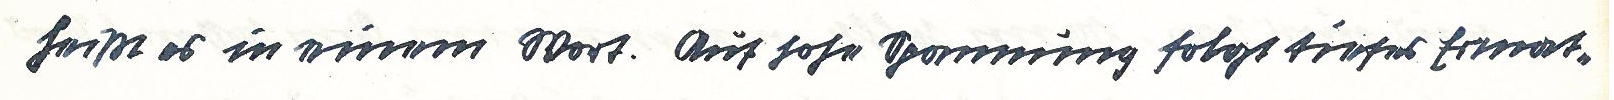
heißt es in einem Wort. Auf hohe Spannung folgt tiefes Ermat¬
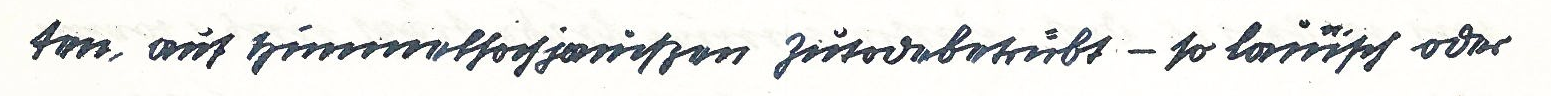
ten, auf Himmelhochjauchzen Zutodebetrübt – so launisch oder
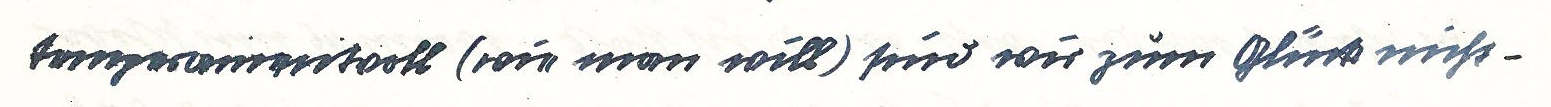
temperamentvoll (wie man will) sind wir zum Glück nicht –
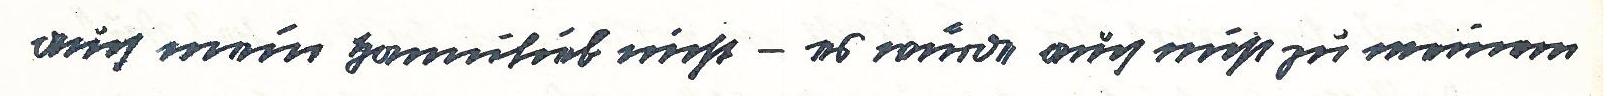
auch mein lieb nicht – es würde auch nicht zu meinem
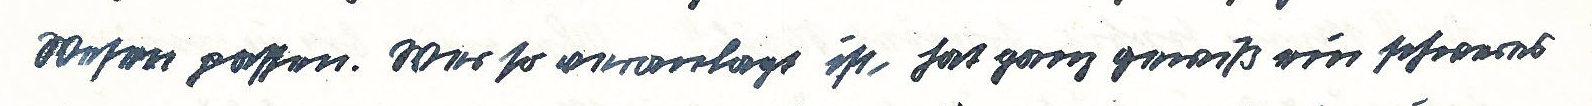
Wesen passen. Wer so veranlagt ist, hat ganz gewiss ein schweres
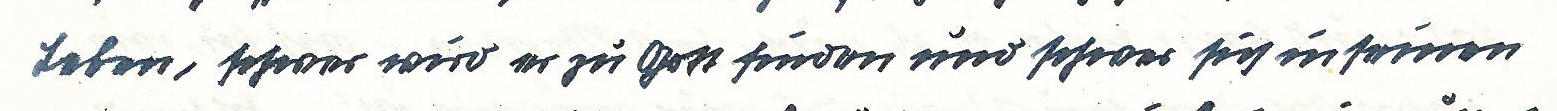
Leben, schwer wird er zu Gott finden und schwer sich in seinen
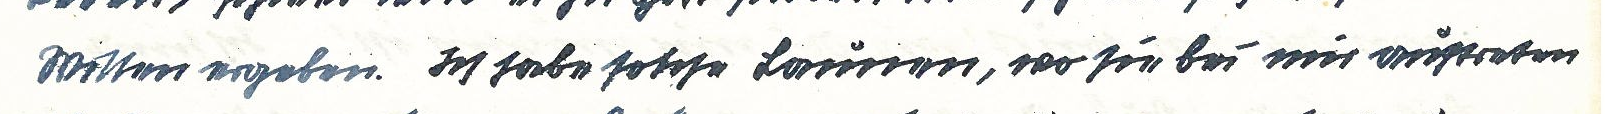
Willen ergeben. Ich habe solche Launen, wo sie bei mir auftreten
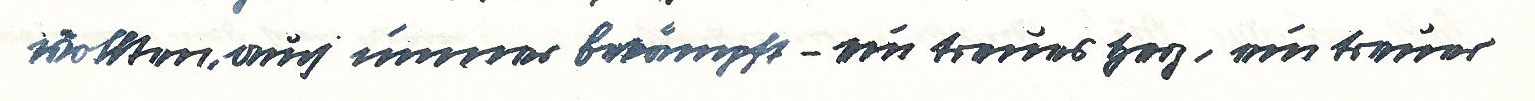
wollten, auch immer bekämpft – ein treues Herz, ein treuer
